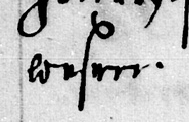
wesens.
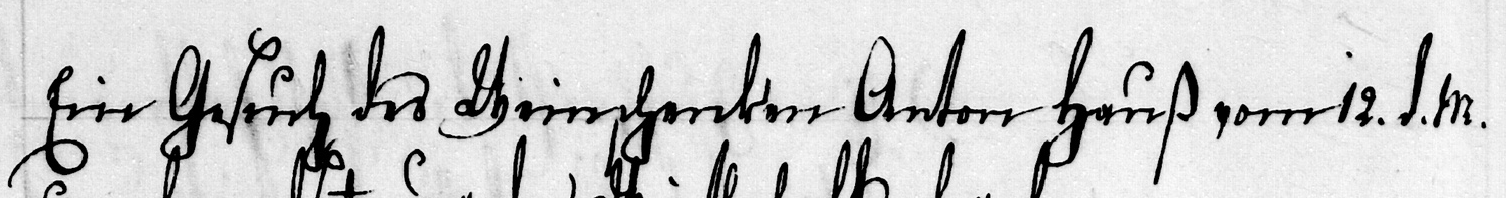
Ein Gesuch des Weinschenken Anton Hauß vom 12. d. M.
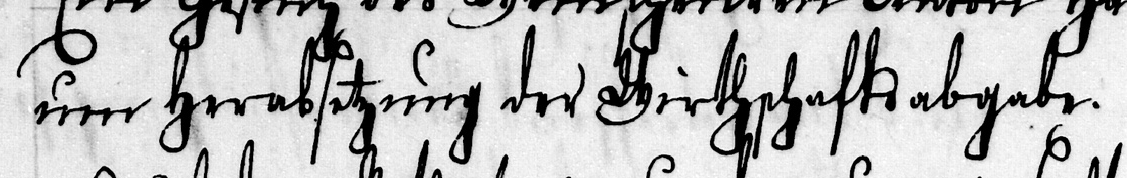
um Herabsetzung der Wirthschaftsabgabe.
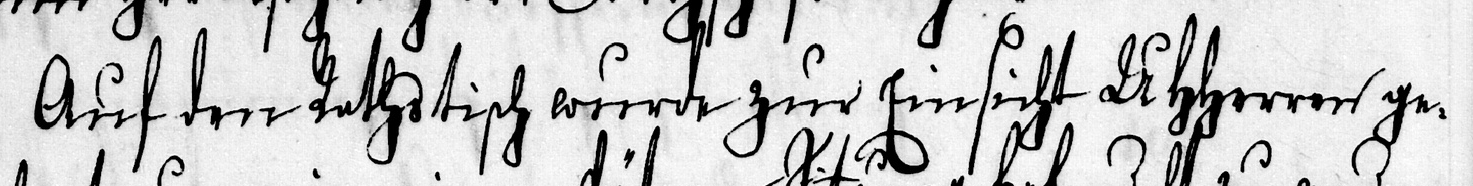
Auf den Rathstisch wurde zur Einsicht UHHerren ge¬
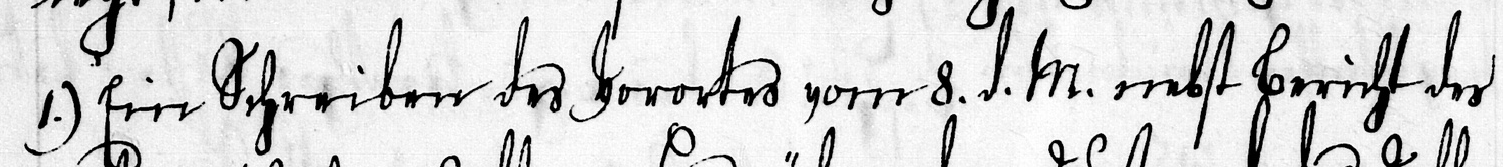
1.) Ein Schreiben des Vorortes vom 8. d. M. nebst Bericht des
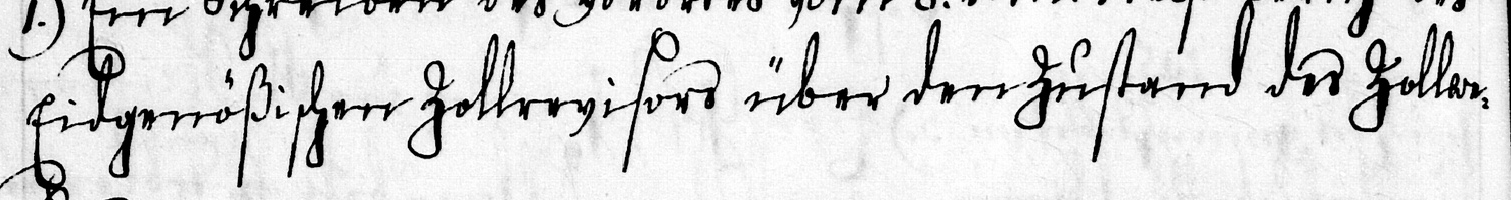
Eidgenößischen Zollrevisors über den Zustand des Zoll¬
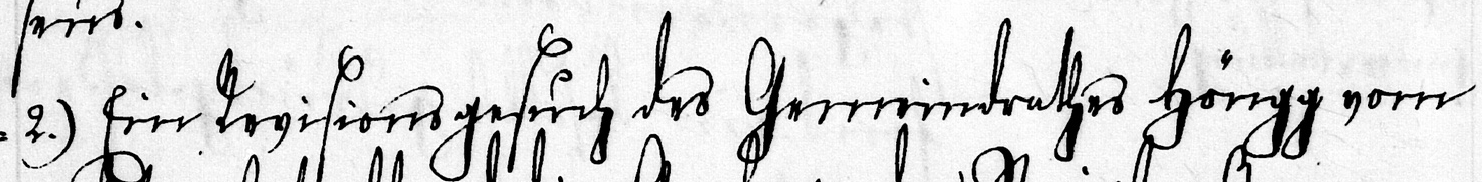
2.) Ein Revisionsgesuch des Gemeindrathes Höngg vom
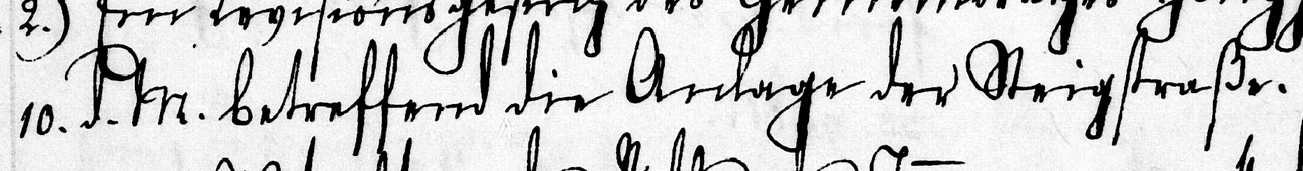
10. d. M. betreffend die Anlage der Steigstraße.
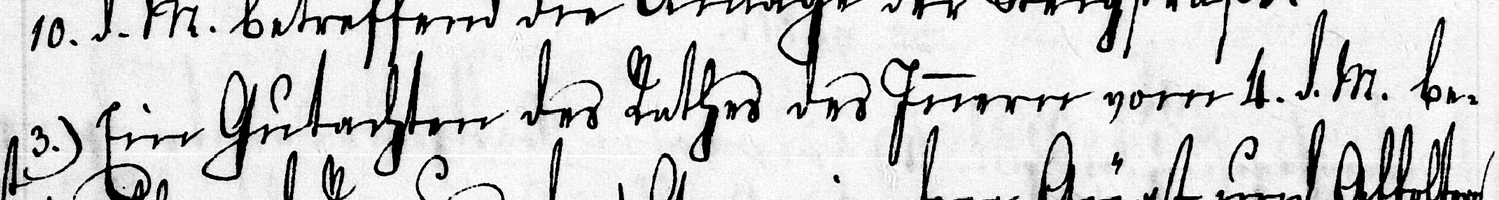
3.) Ein Gutachten des Rathes des Innern vom 4. d. M. be¬
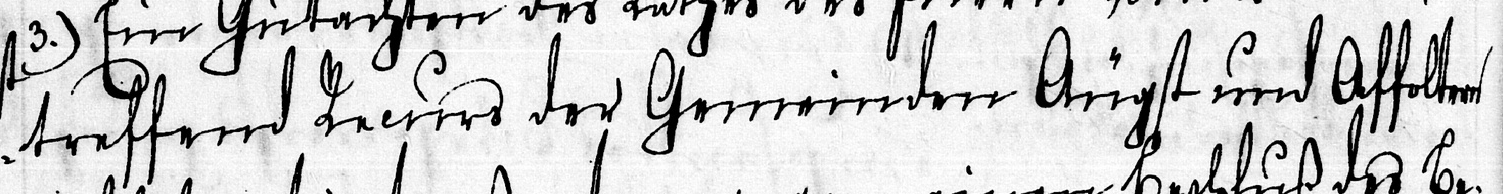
treffend Recurs der Gemeinden Äugst und Affol¬
